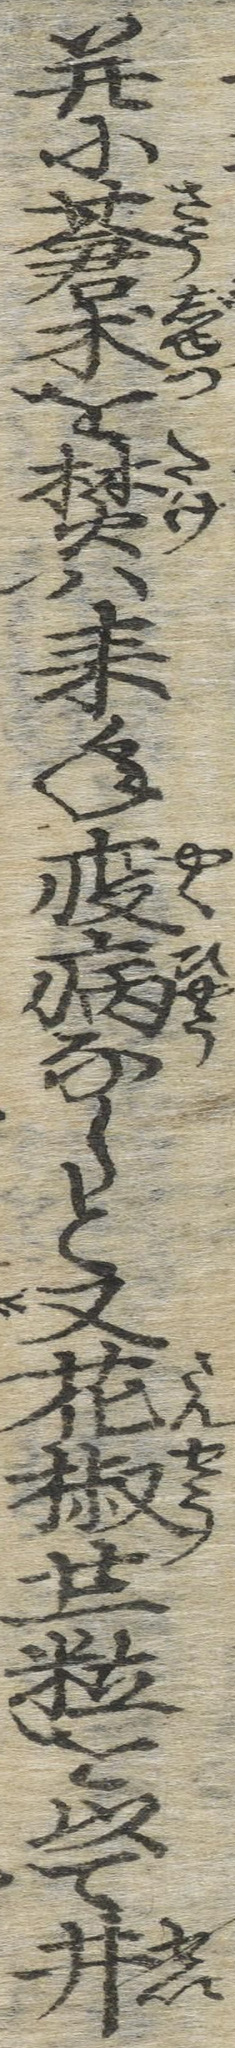并に蒼朮を焚は来年疫病なしと又花椒廿一粒を以て井
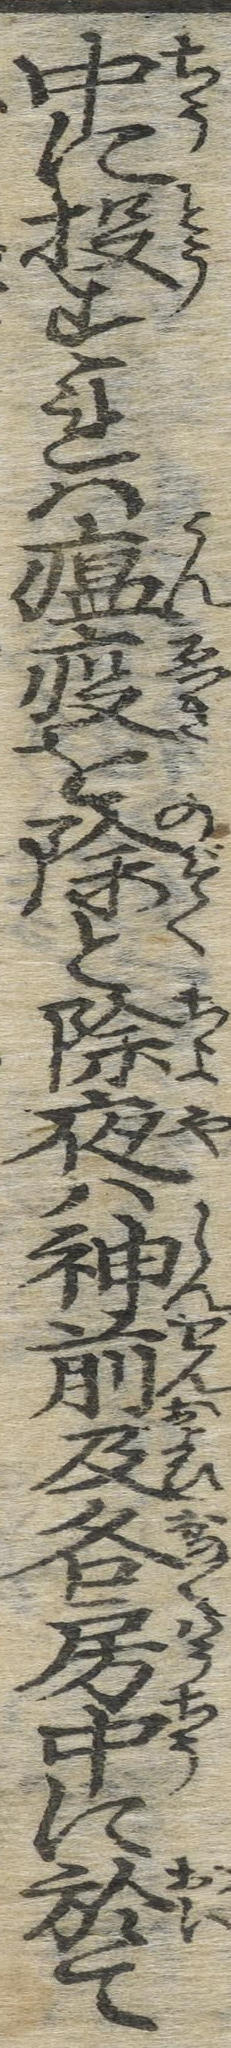中に投すれは瘟疫を除と除夜は神前及各房中に於て
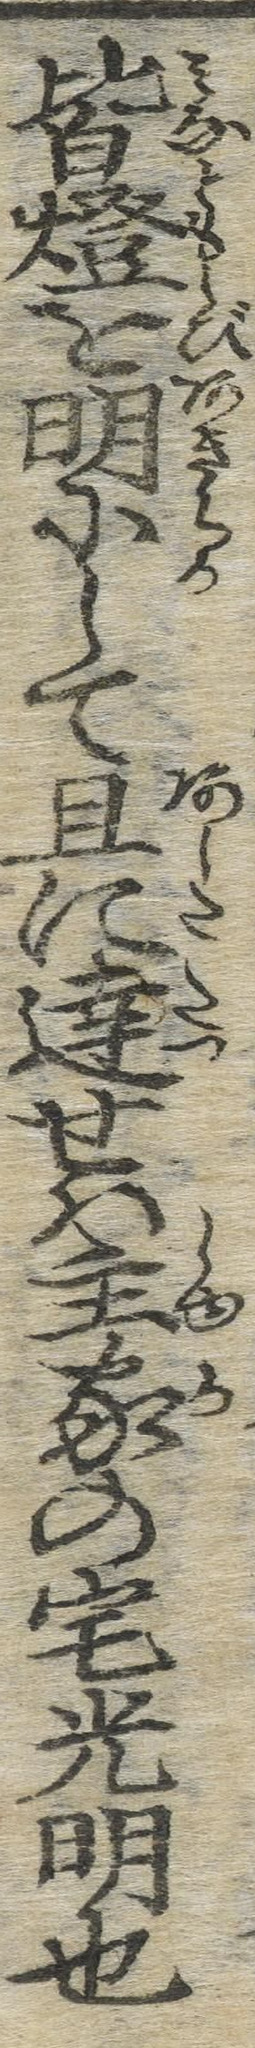皆燈を明にして旦に達せは主家の宅光明也
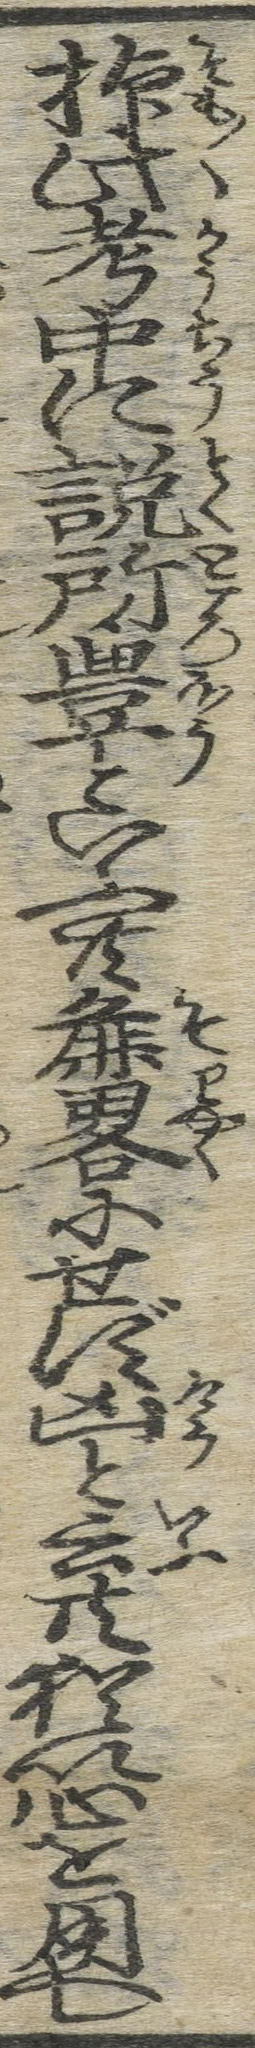抑此考中に説所豊といふ共麁畧にせず凶と云共程以心を用へし
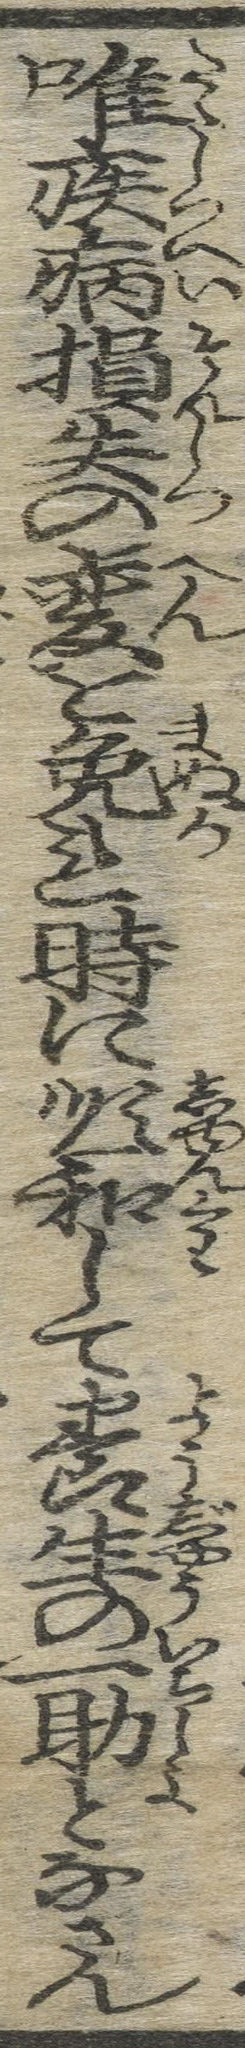唯疾病損失の変を免れ時に順和して養生の一助となさん
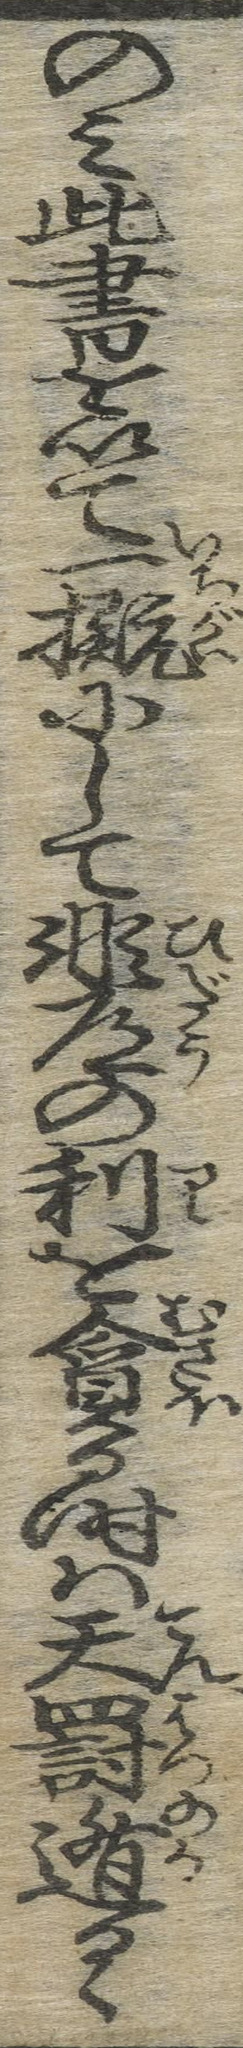のみ此書を以て一概にして非常の利を貪る時は天罰遁るゝ

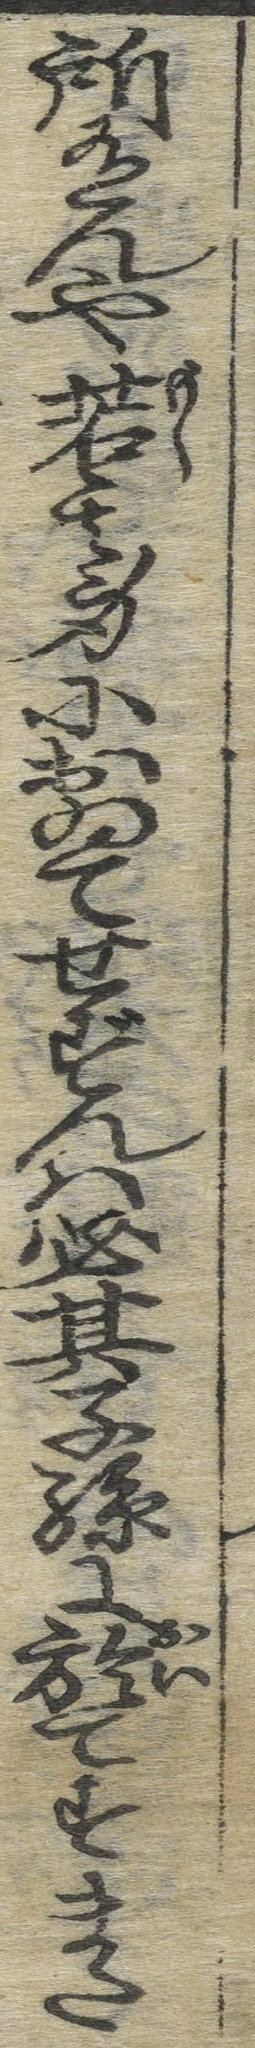所有んや若其身におゐてせずんは必其子孫に於てすまた
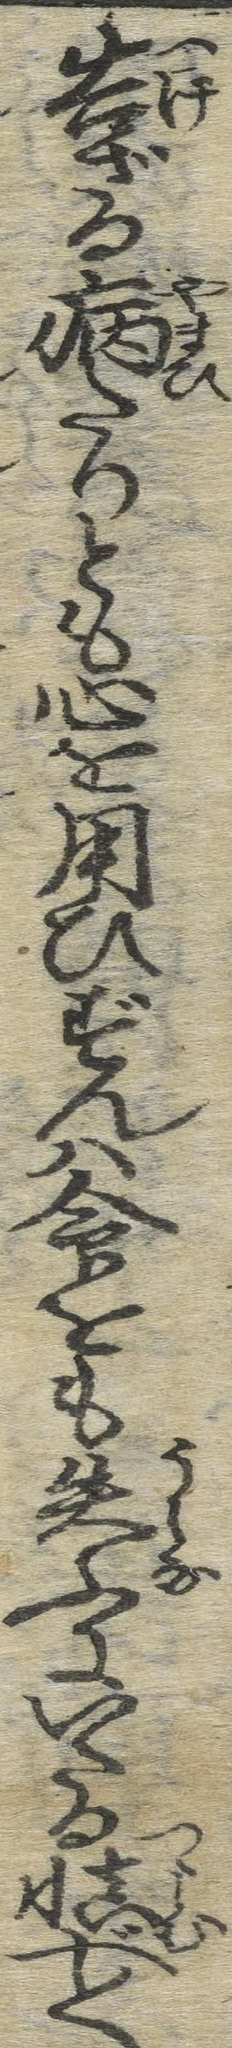告ざる病たりとも心を用ひずんは命をも失ふにいたる慎べく
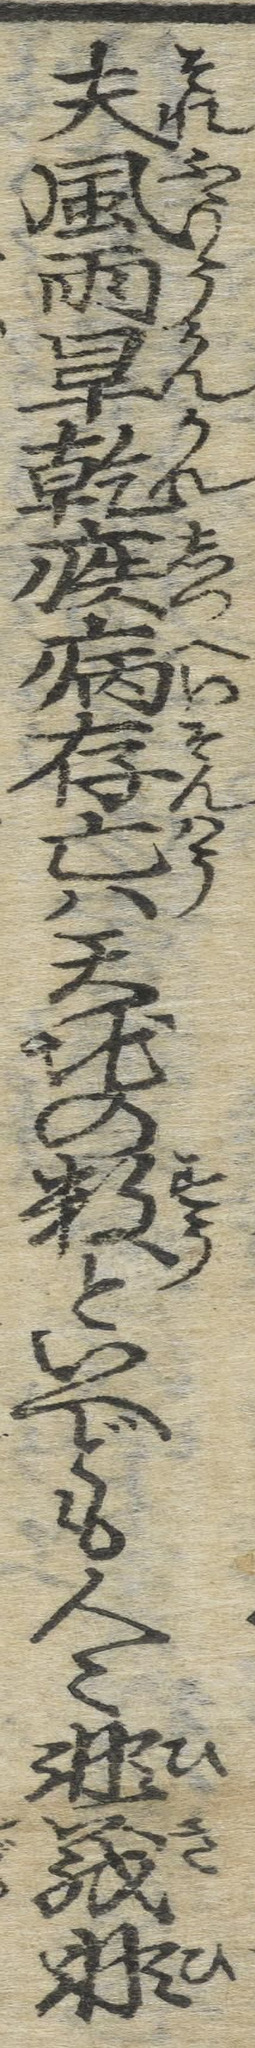夫風雨旱乾疾病存亡は天地の数といへども人〻非義非
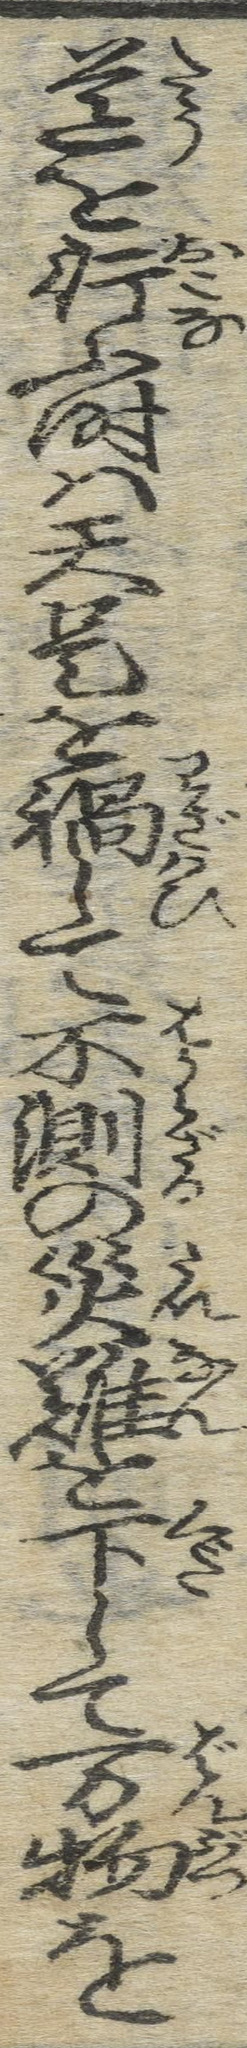道を行ふ時は天是を禍して不測の災難を下して万物を
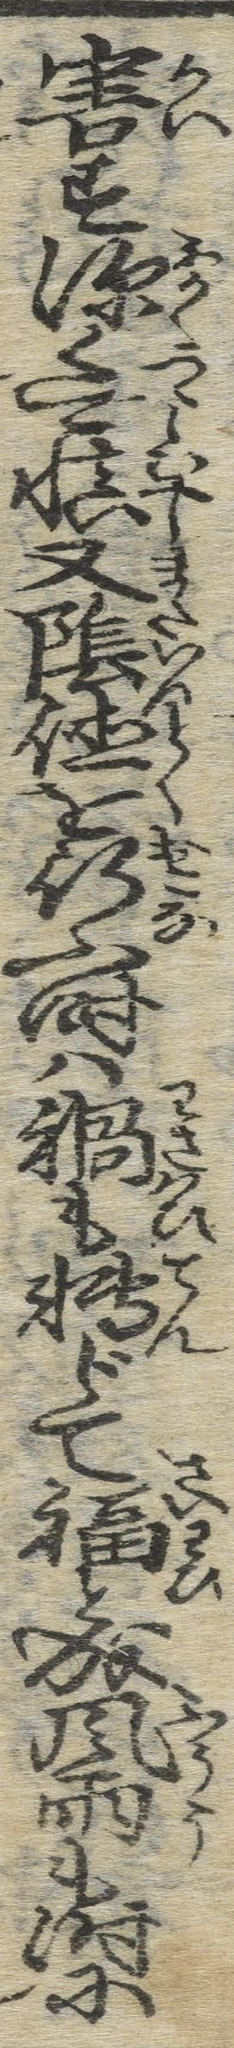害す深くて慎又陰徳を行ふ時は禍も転じて福と成風雨も時に
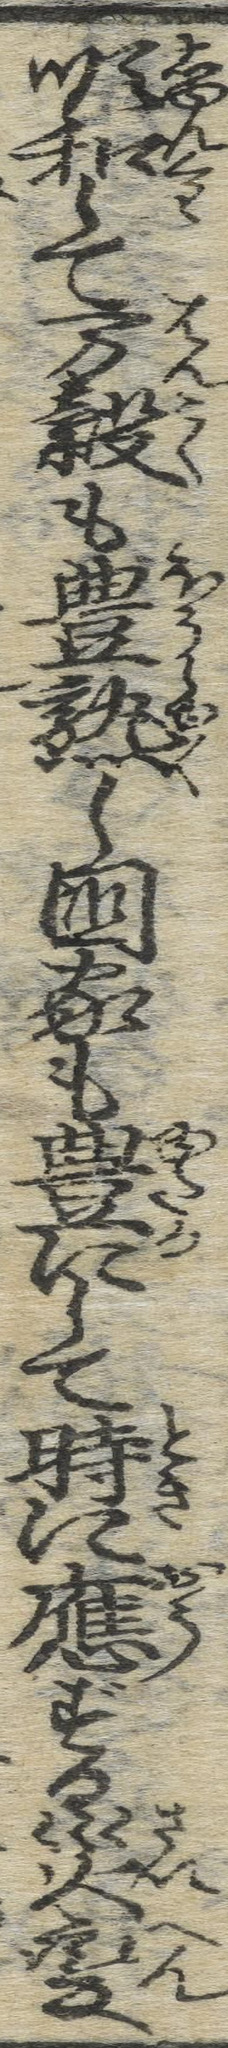順和して万穀も豊熟し国家も豊にして時に應ずる災変
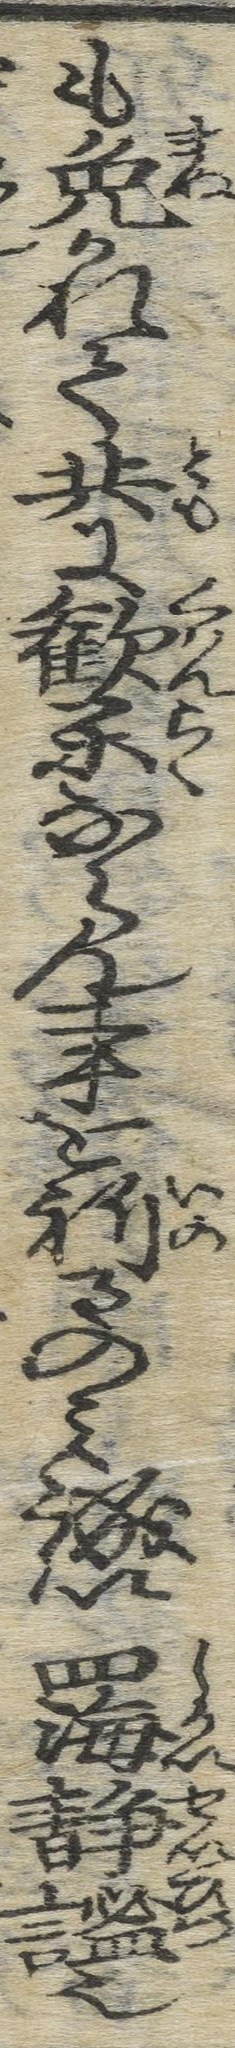も免かれて共に歓楽ならん事を祈るのみ誠以四海静謐也
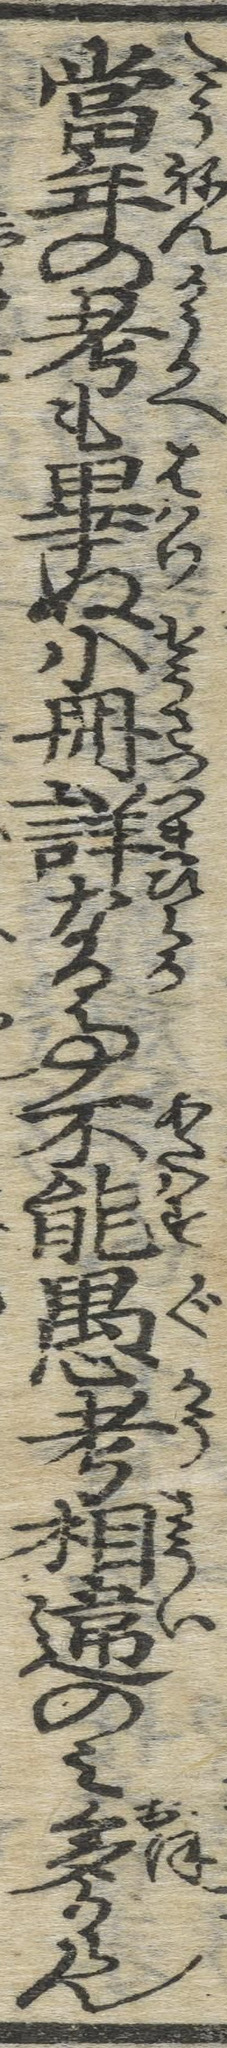當年の考も畢ぬ小冊詳なる事不能愚考相違のみ多からん
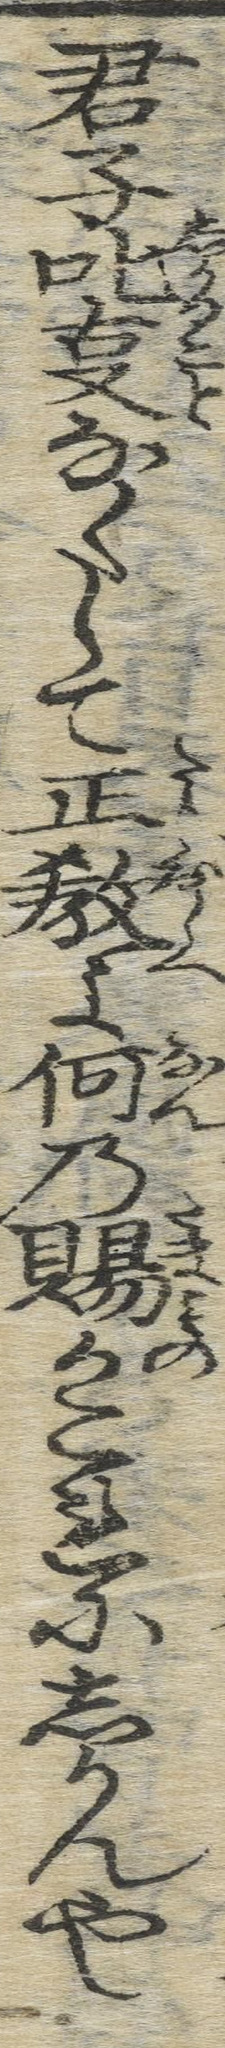君子叱事なくして正教に何の賜かこれにしかんや
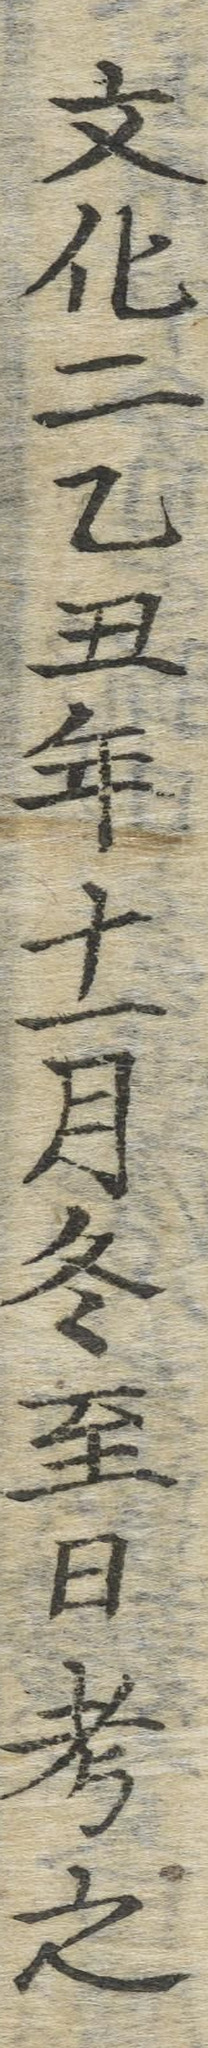文化二乙丑年十一月冬至日考之
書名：[晴雨考]
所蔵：東京大学地震研究所図書室 Earthquake Research Institute Library, The University of Tokyo, JAPAN
